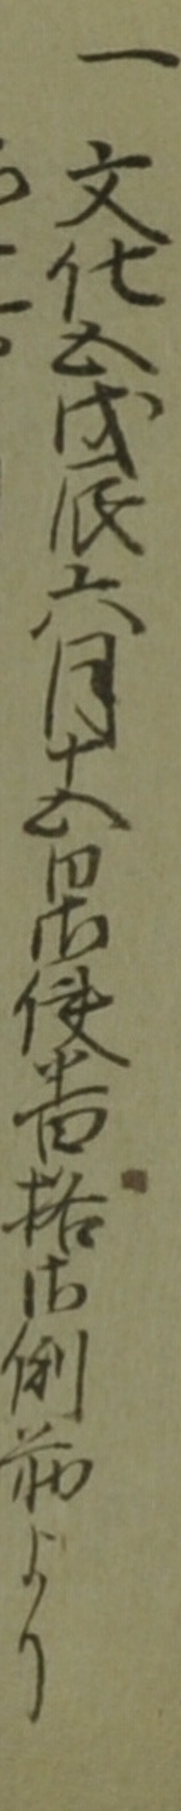一文化五戊辰六月十五日御使番格御側勤より
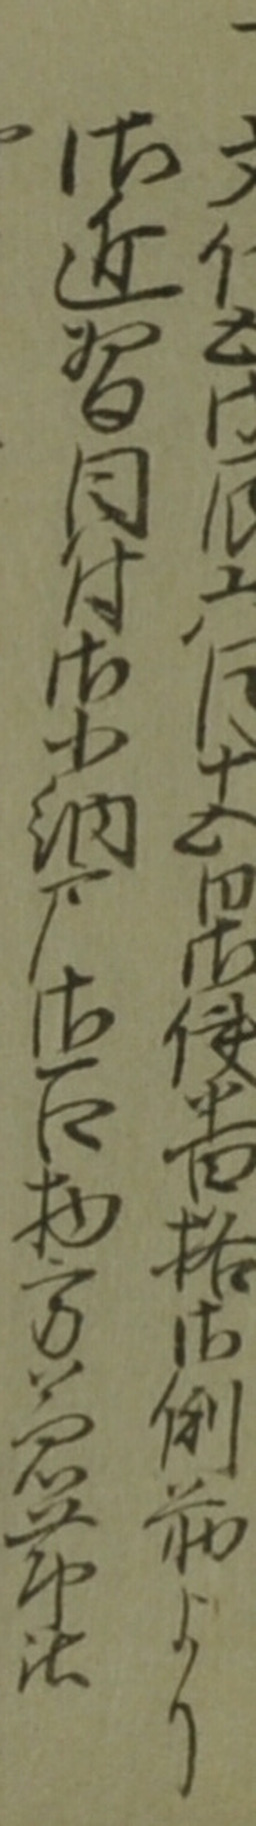御近習目付御小納戸御召物方兼帯被
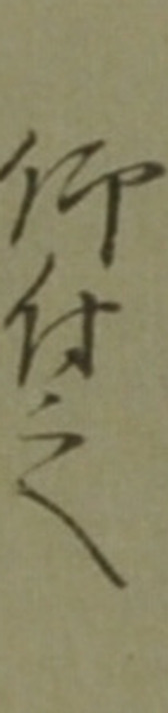仰付之
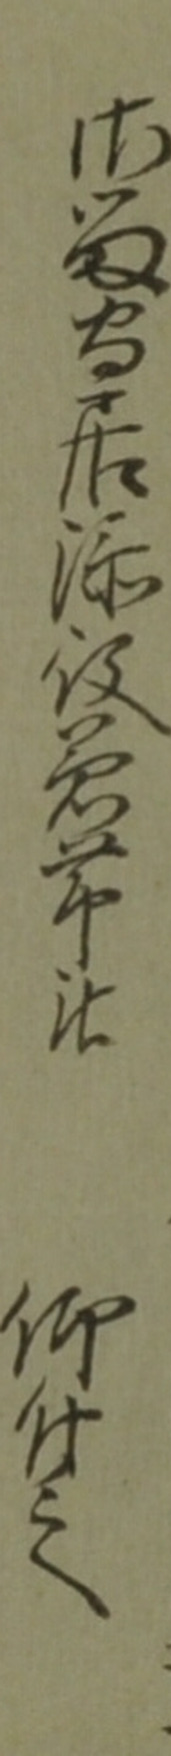御留守居添役兼帯被仰付之
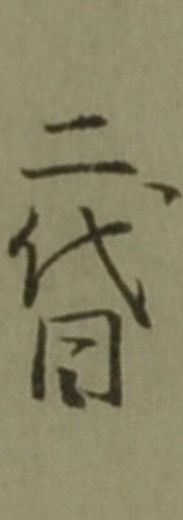二代目
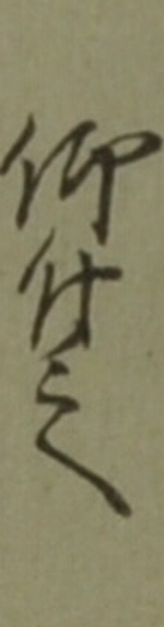仰付之
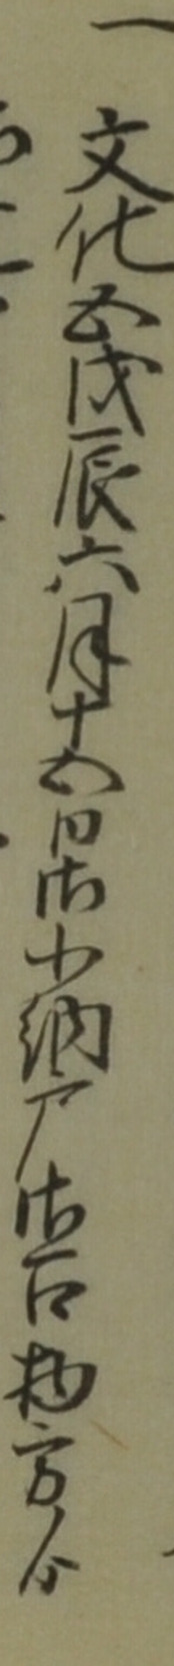一文化五戊辰六月十五日御小納戸御召物方ゟ
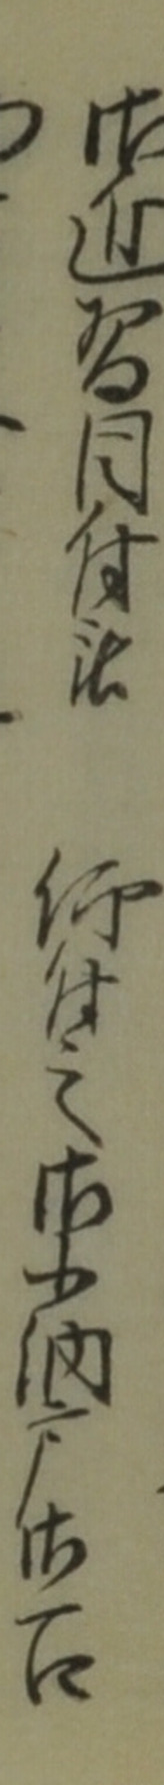御近習目付被仰付之御小納戸御召
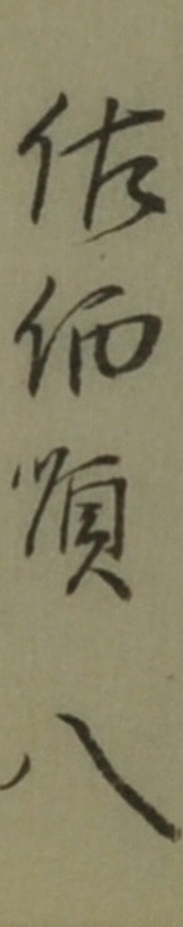佐伯順八
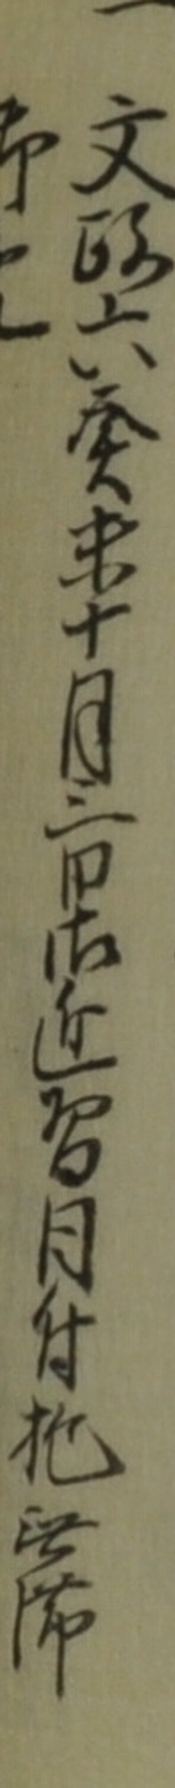一文政六癸未十月三日御近習目付抱無滞
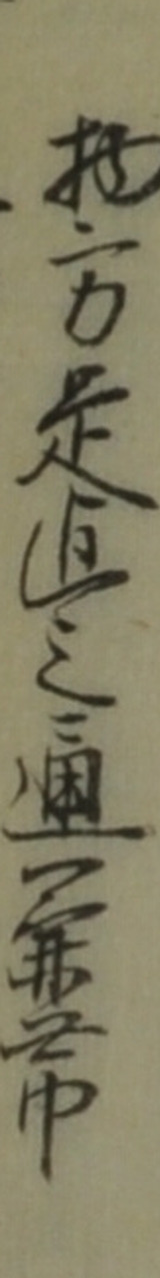物方是迄之通兼帯
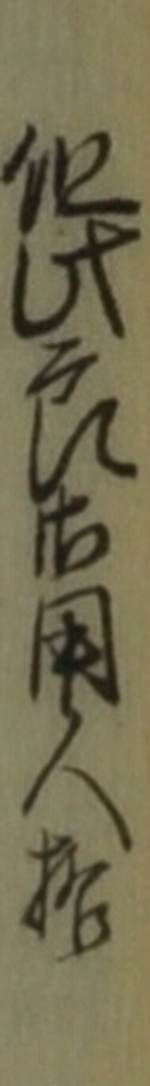但此節御用人格
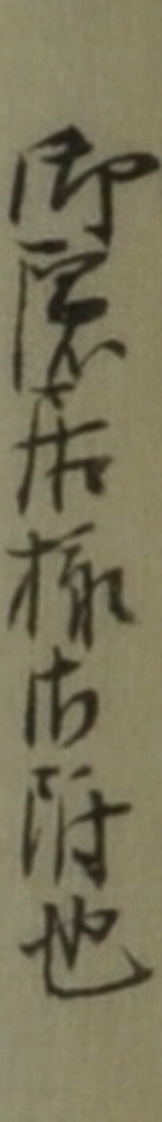御隠居様御附也
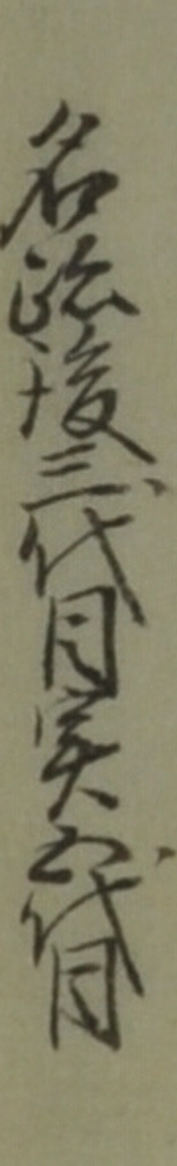名跡後三代目実五代目
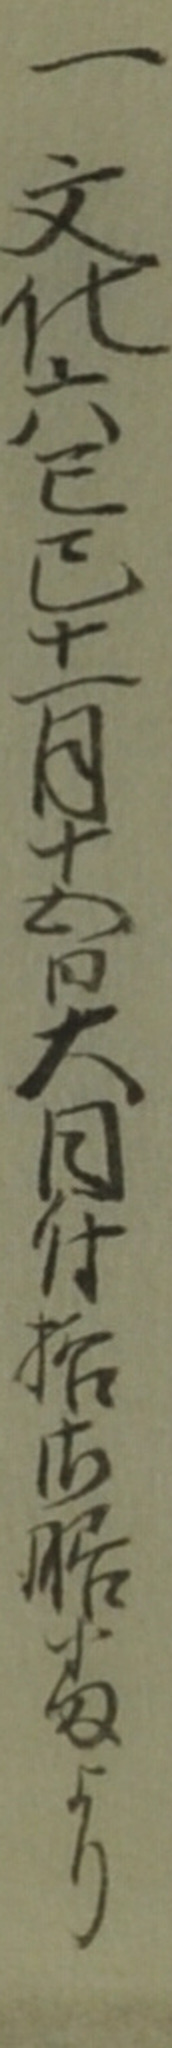一文化六己巳十一月十五日大目付格御膳番より
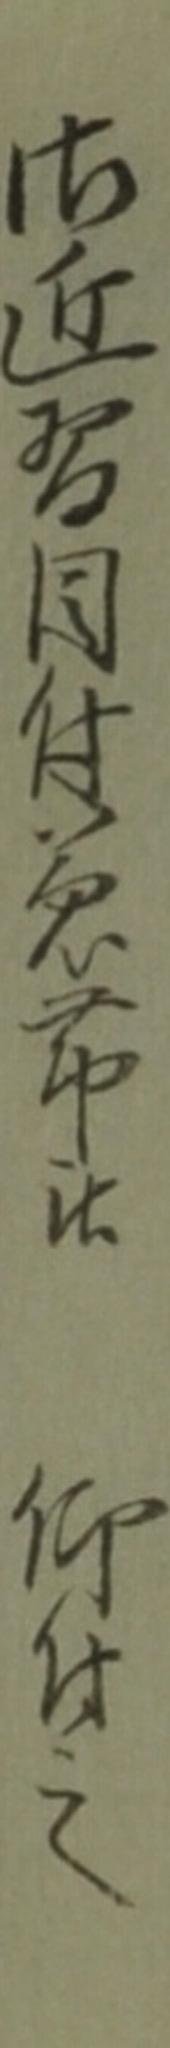御近習目付兼帯被仰付之
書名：諸御役代々録（四）
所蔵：伊那市立高遠町図書館・合同会社AMANE
